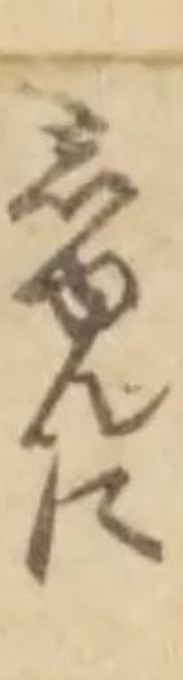しゆんに
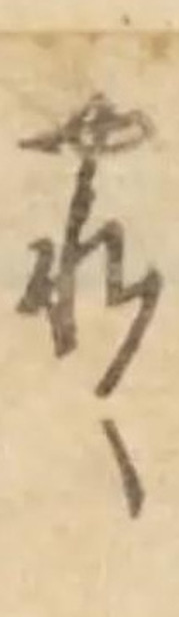やれ〳〵
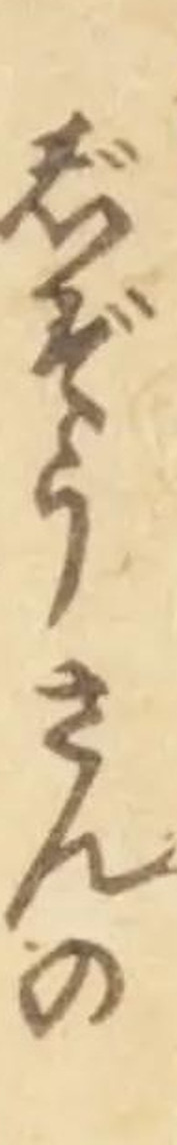じぞうさんの
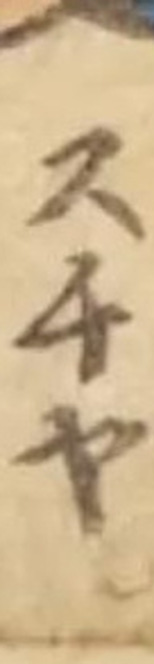スチヤ
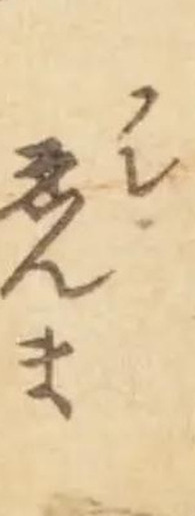ゑんま
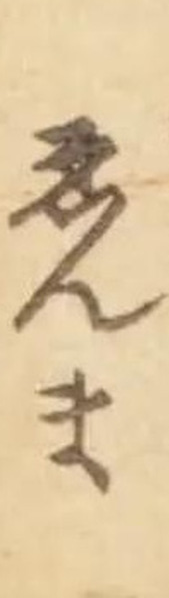ゑんま
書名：地震冥途ノ図
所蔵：国立国会図書館 National Diet Library, JAPAN
